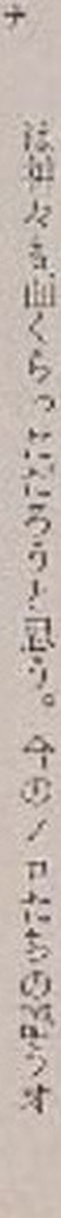は神々も面くらっただろうと思う。今のノロたちの謡うオ
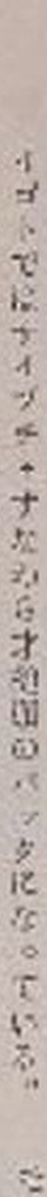イゴトではイヅチャすなわちのバッタになっている。
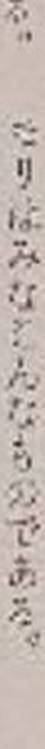モリはみなこんなものである。
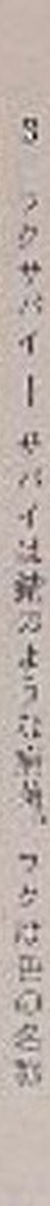３フクサバイ―サバイはのような。フクは色の名前
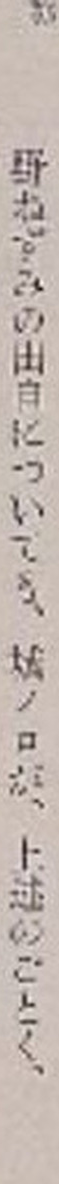野ねずみの出自についても、城ノロが、上述のごとく、
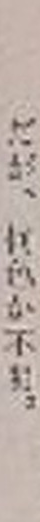だが、何色か不明。
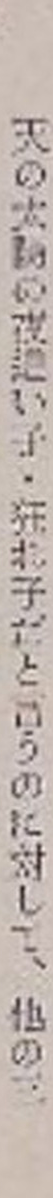天の太陽の夜這い子・狂れ子だというのに対して、他の三
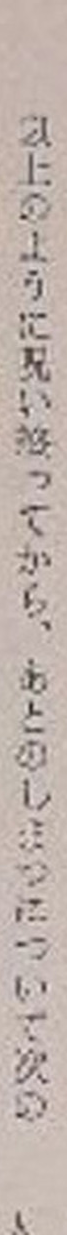以上のように呪い終ってから、あとのしまつについて次の
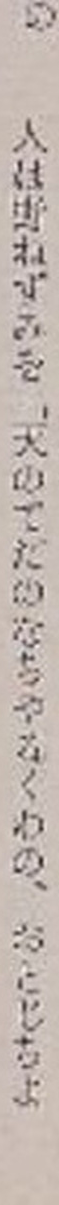人は野ねずみを「天のてだのなちやるくわの、おとじちよ
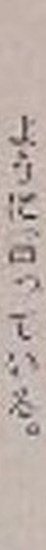ように言っている。
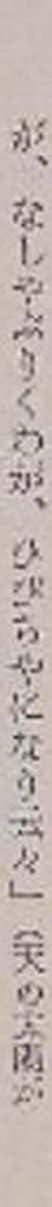が、なしやぶりくわが、ひびちやになり云々」(天の太陽が
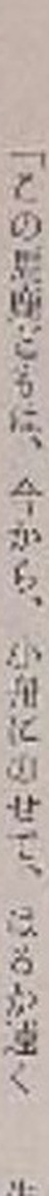「この馬鹿どもは、今から、小舟にのせて、はるか遠く
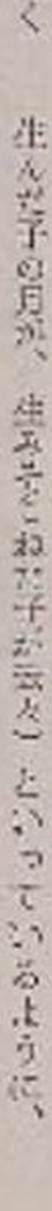生んだ子の月が、生みそこねた子が云々)といっているように、
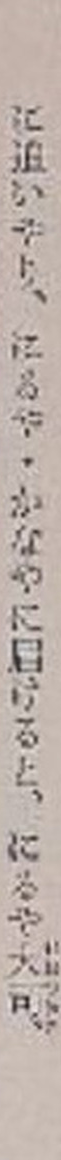に追いやり、にるや・かなやに届けると、にるや大司、
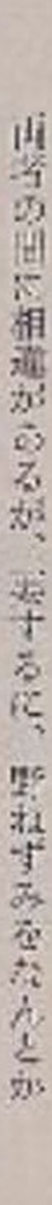両者の間に相違があるが、要するに、野ねずみをなんとか
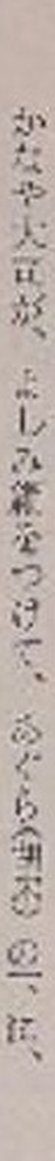かなや大司が、よしみをつけて、あぐら(胡)の、
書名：沖縄口承文芸
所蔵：University of the Ryukyus Library
